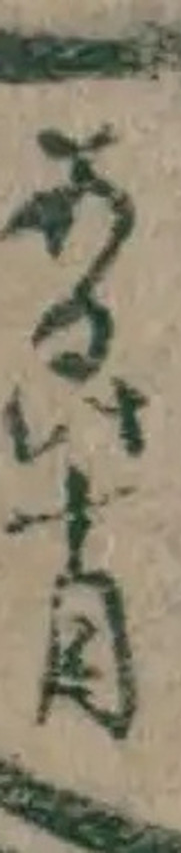ある此十月
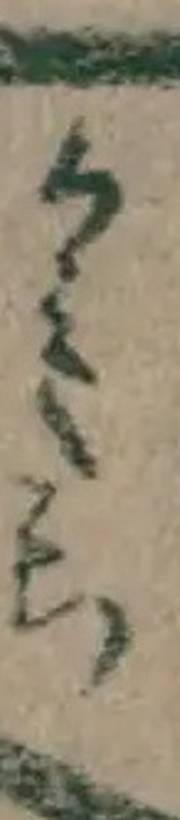かみたち
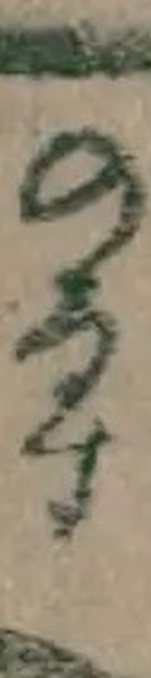のるす
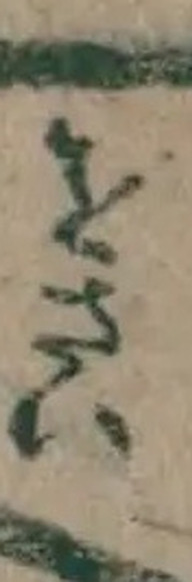をさい
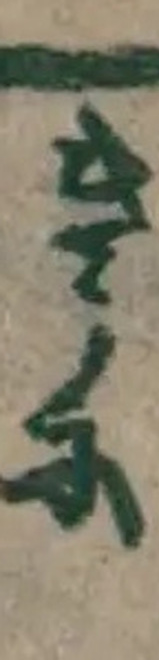きうに
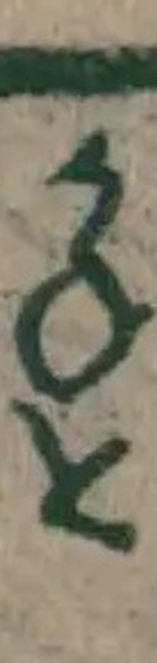かねを
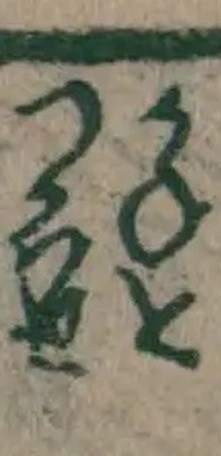つかはせ
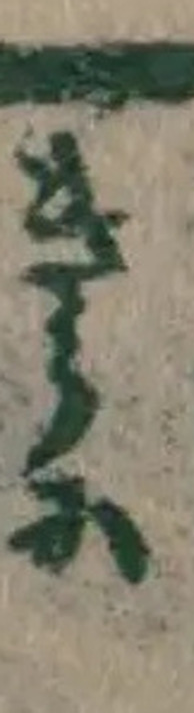きうに
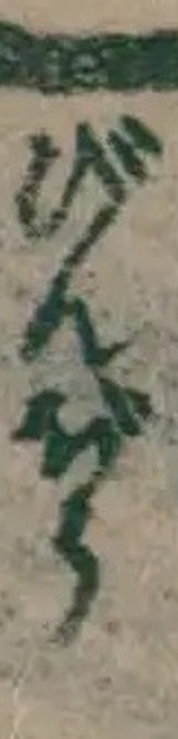びんぼう
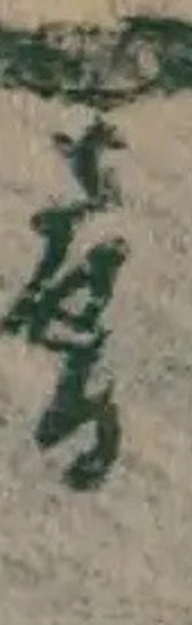させる
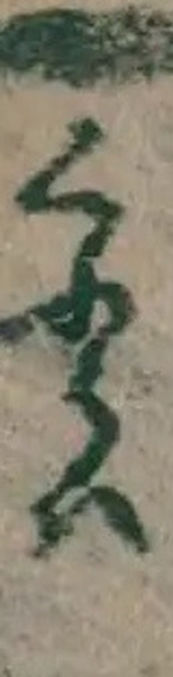くふうは

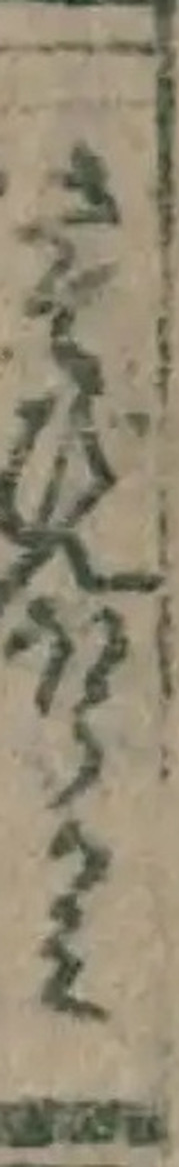さてびんほうかみ
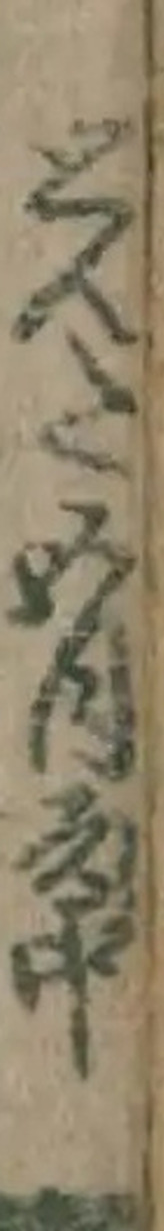とんた五月雨中
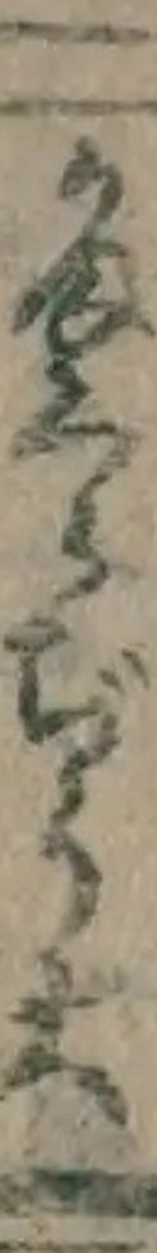かまくらぢう大
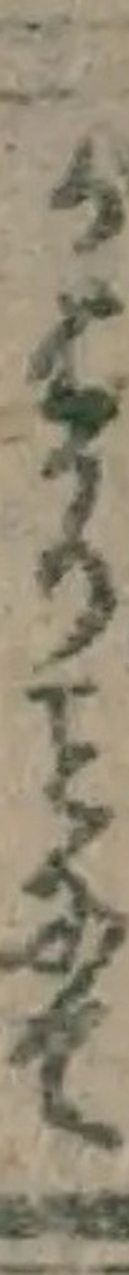がはかりことにて
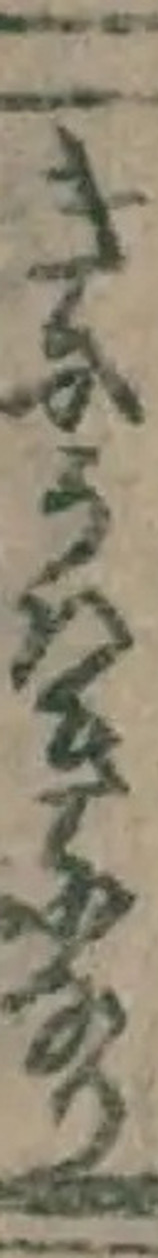きにうはきになり
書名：頓作時雨月 3巻
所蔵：国立国会図書館 National Diet Library, JAPAN
